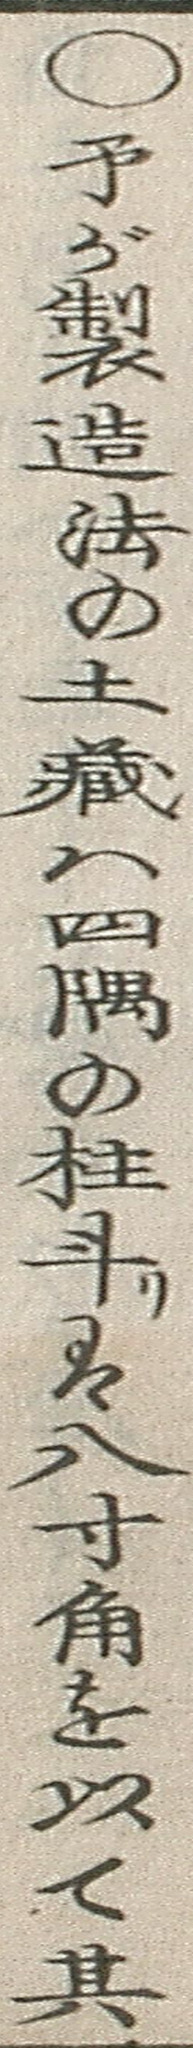〇予が製造法の土蔵は四隅の柱斗八寸角を以て其
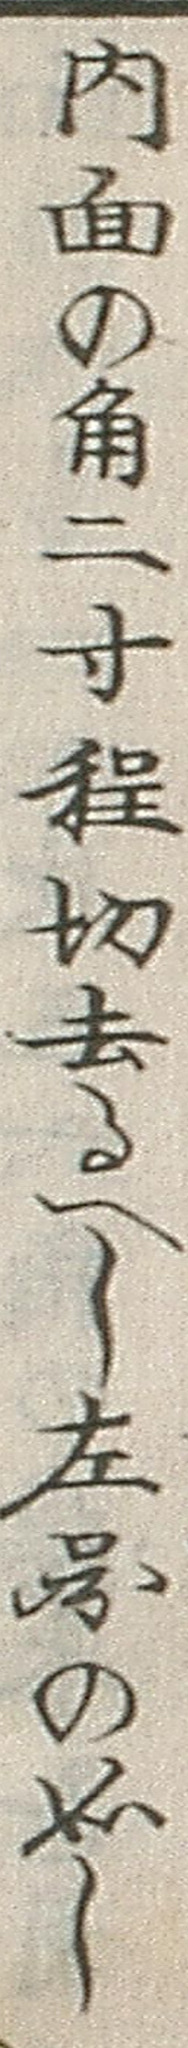内面の角二寸程切去るへし左図の如し
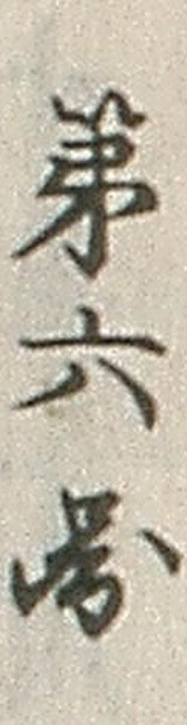第六図

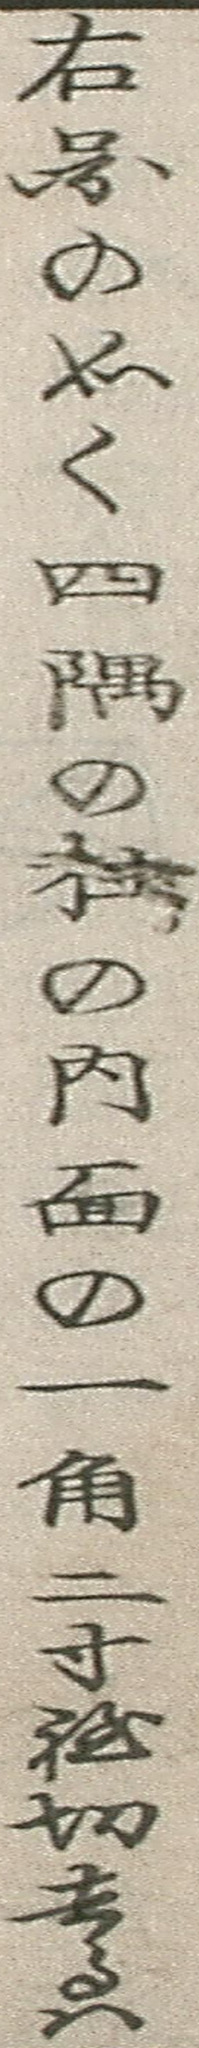右図の如く四隅の柱の内面の一角二寸程切去るは
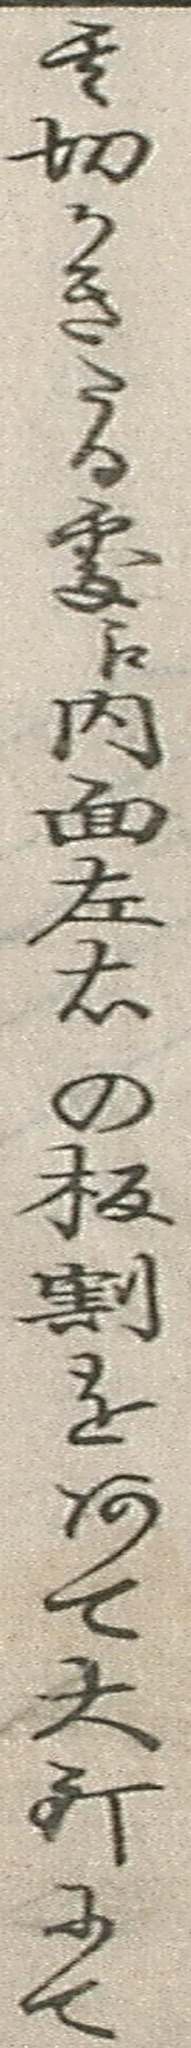其切かきたる処江内面左右の板割をあて大釘にて
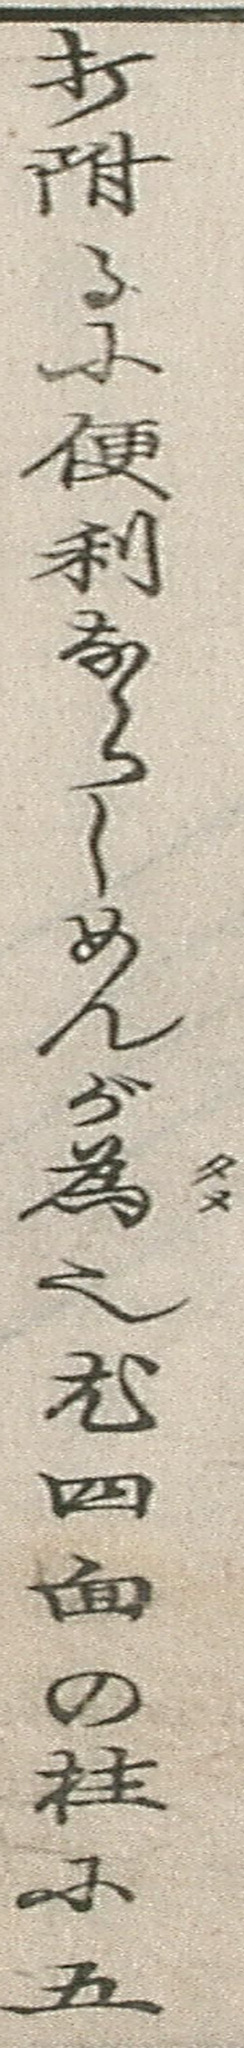打附るに便利ならしめんが為也尤四面の柱に五
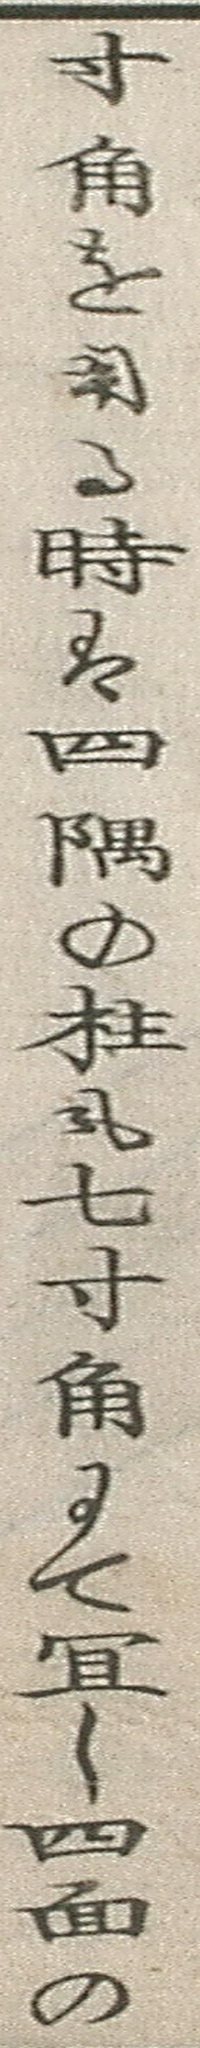寸角を用る時は四隅の柱も七寸角にて宜し四面の
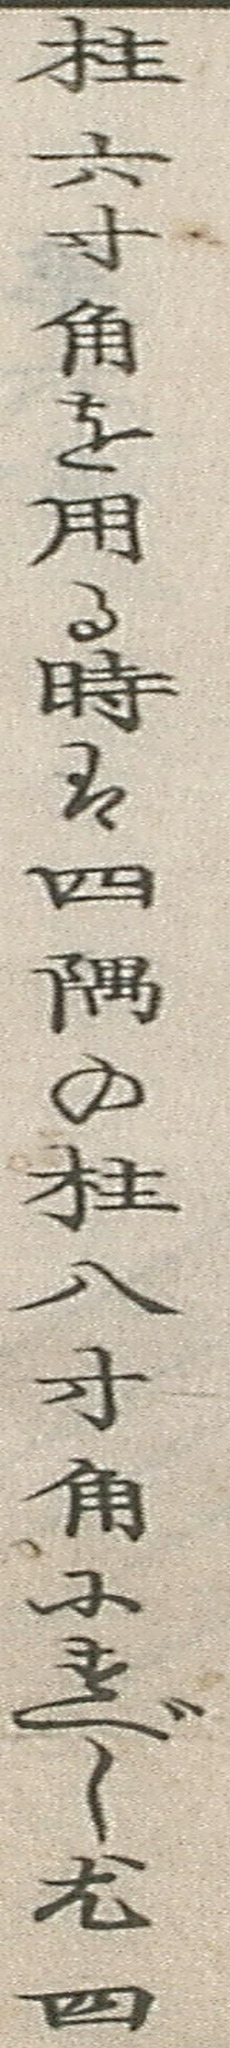柱六寸角を用る時は四隅の柱八寸角にすべし尤四
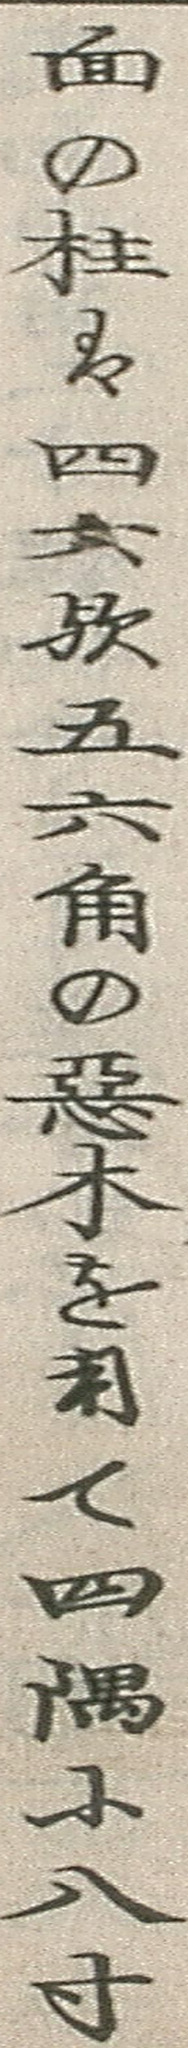面の柱は四六歟五六角の悪木を用て四隅に八寸
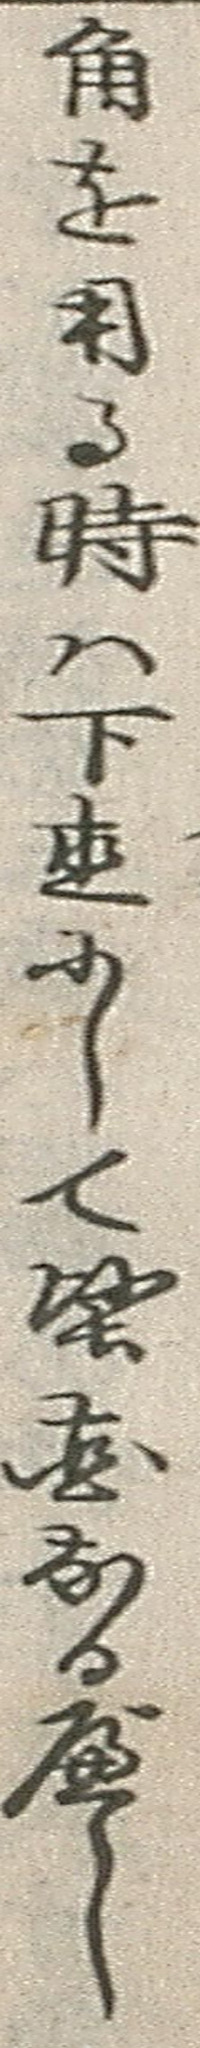角を用る時は下直にして堅固なるべし
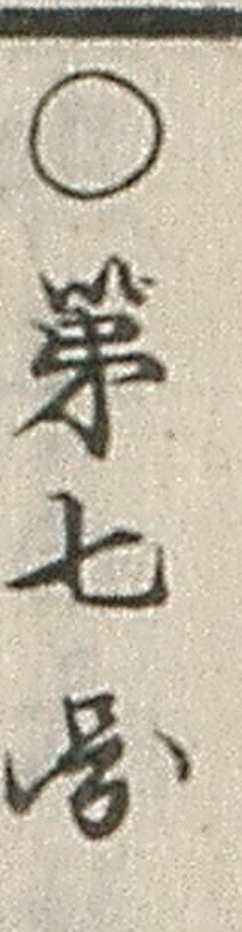〇第七図

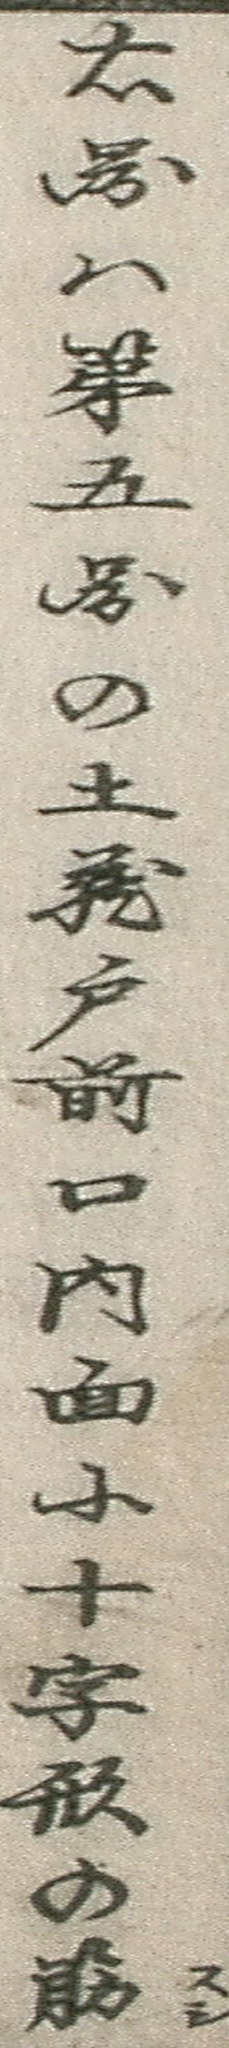右図は第五図の土蔵戸前口内面に十字形の筋
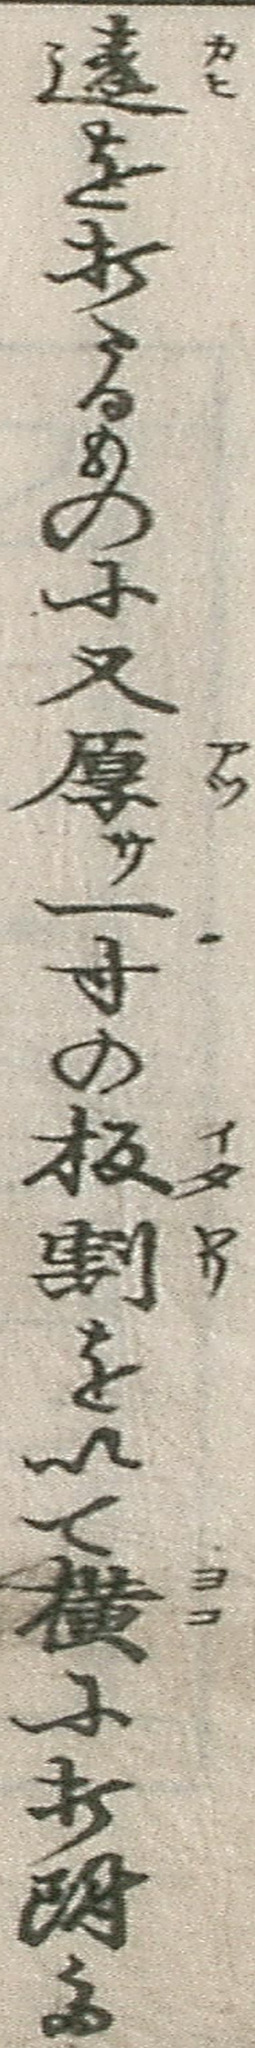違を打たるものに又厚一寸の板割を以て横に打附た
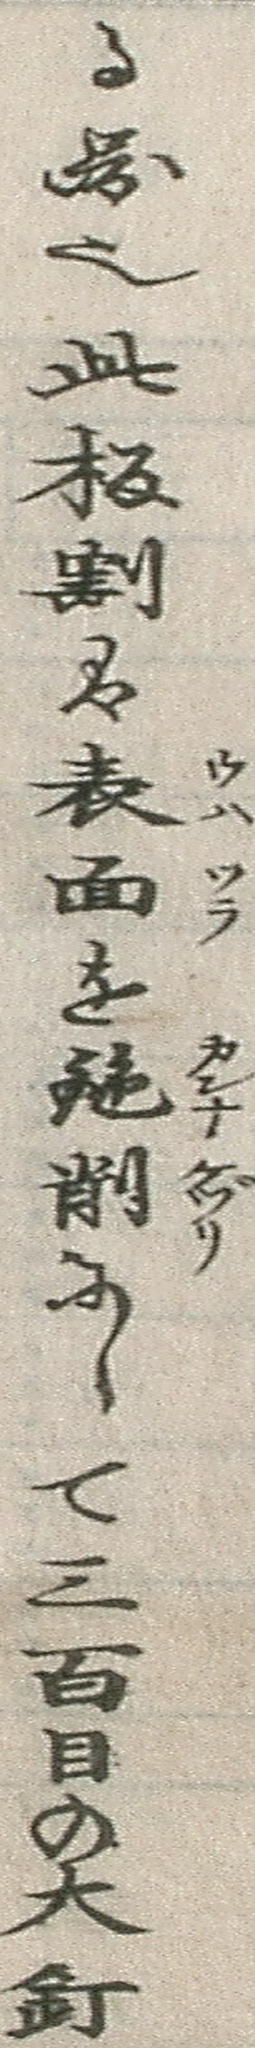る図也此板割は表面を鉋削にして三百目の大釘
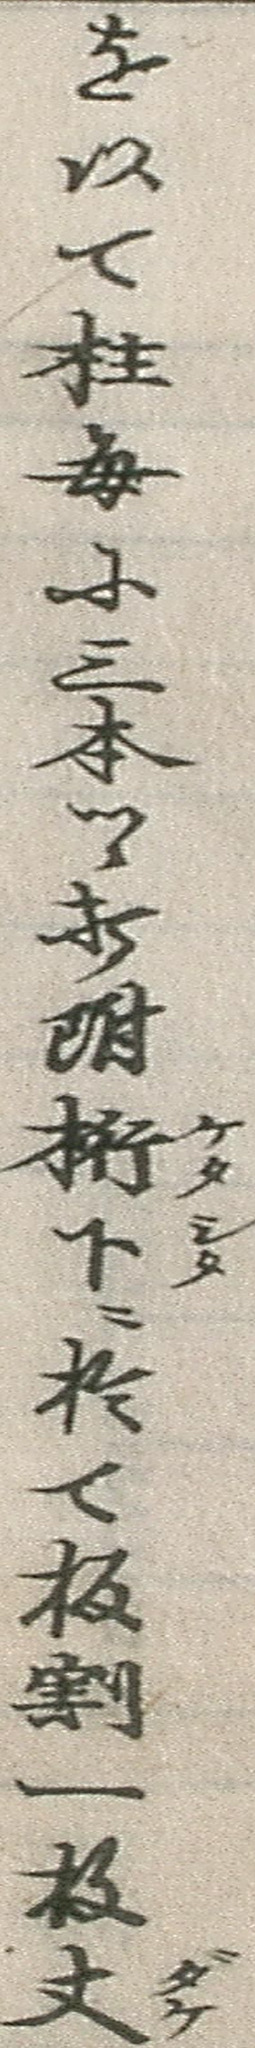を以て柱毎に三本ツヽ打附桁下於て板割一枚丈
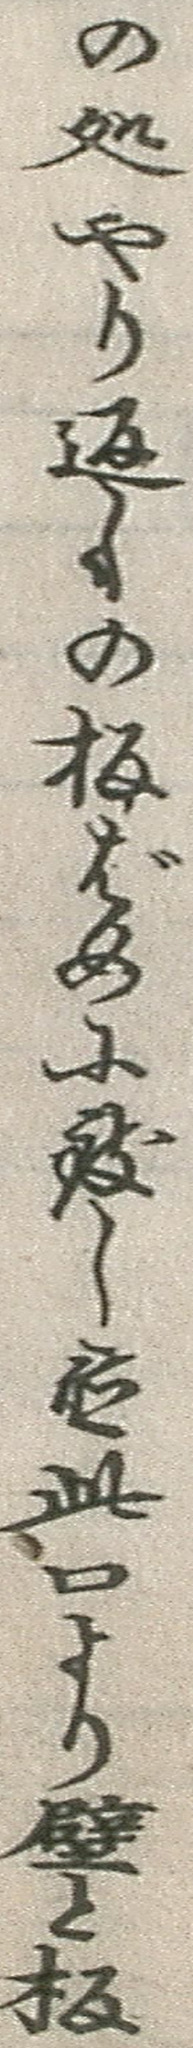の処やり返もの板ばめに致し置此口より壁と板
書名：附録　地震劇風災害豫防法圖説（内題）
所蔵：東京大学地震研究所図書室 Earthquake Research Institute Library, The University of Tokyo, JAPAN
